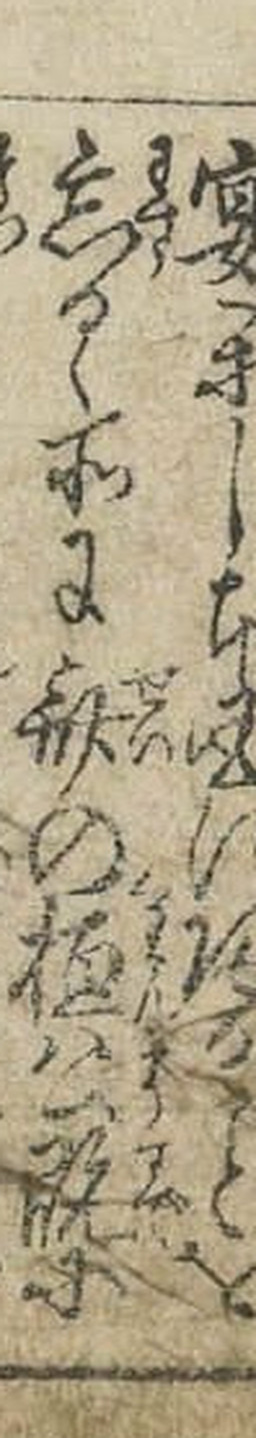忘るゝ所に斉の桓公既に
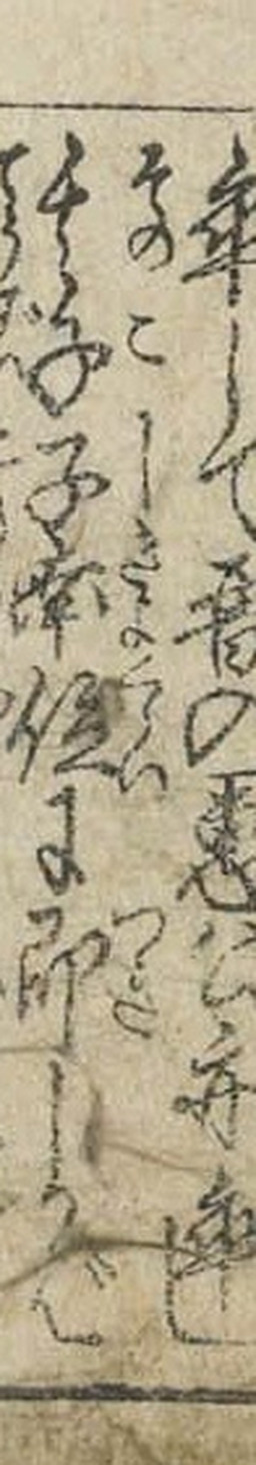其子子圉位に即しかば
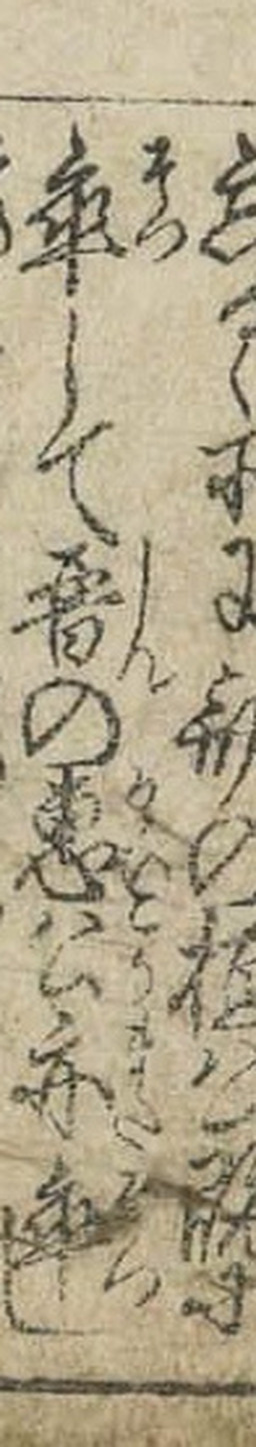卒して晋の恵公亦卒し
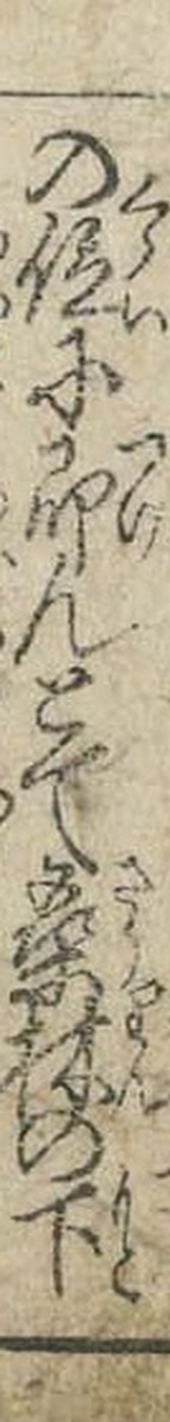の位に即んとて桑林の下
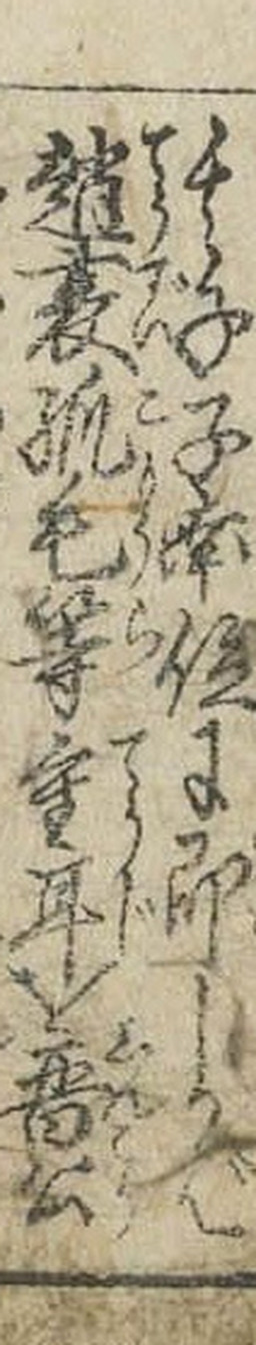趙衰孤毛等重耳を晋公
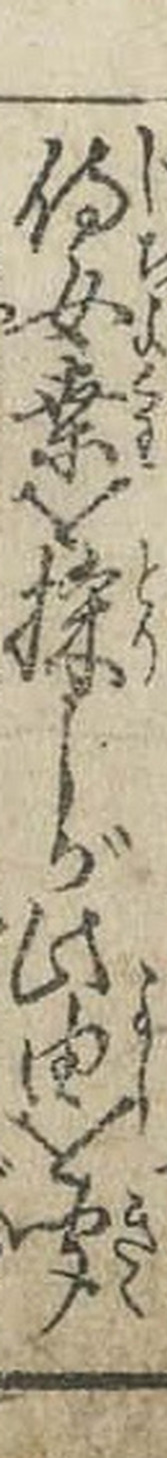侍女桑を採しが此由を聞
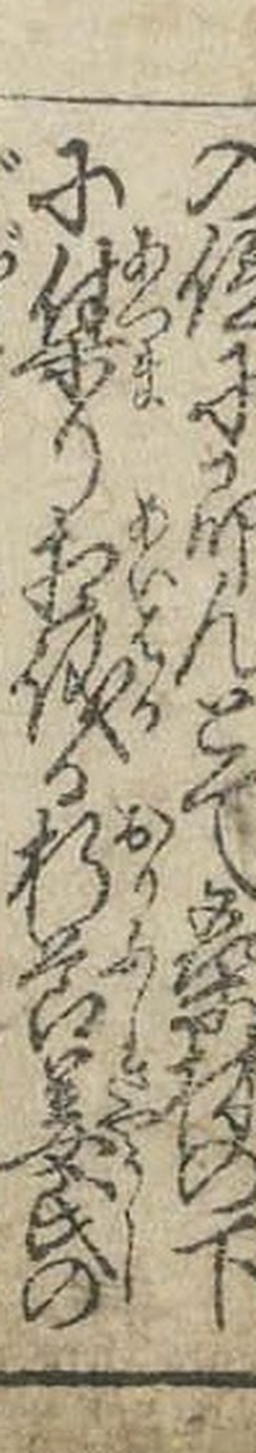に集り相議る折節姜氏の
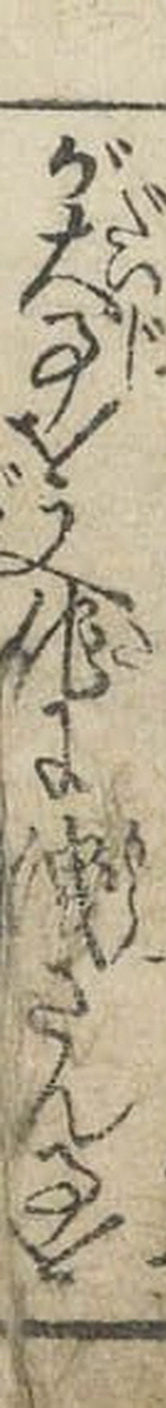が大事を又他に洩さん事を
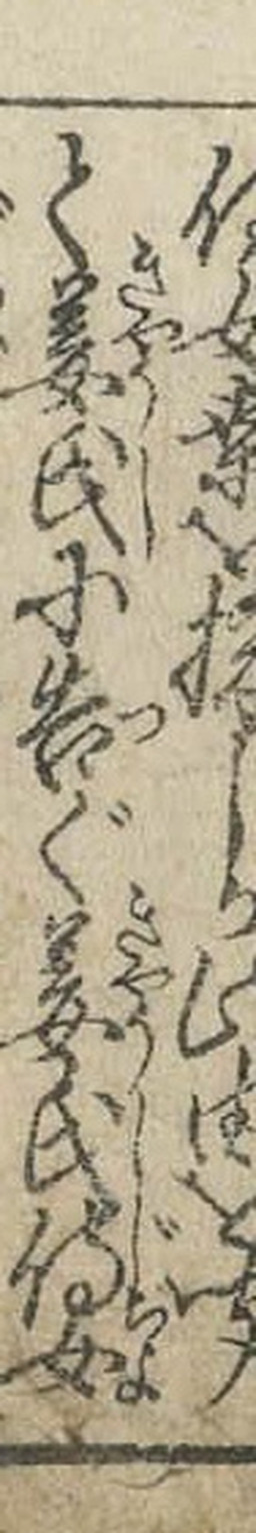て姜氏に告ぐ姜氏侍女
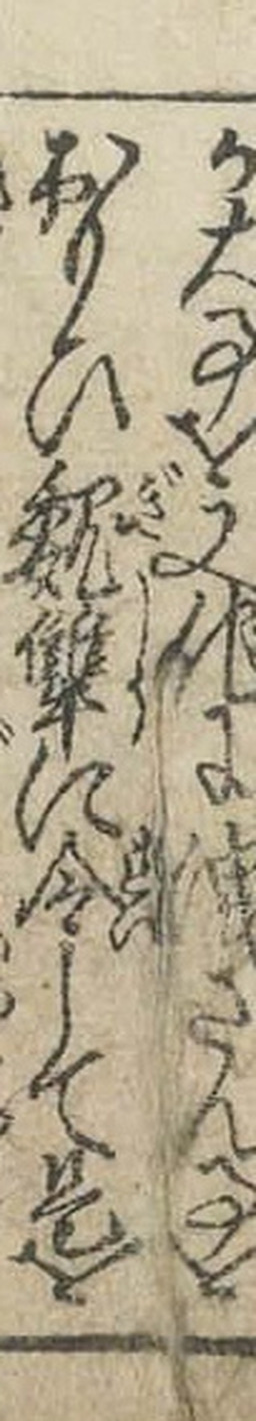おもひ魏犨に令して是を
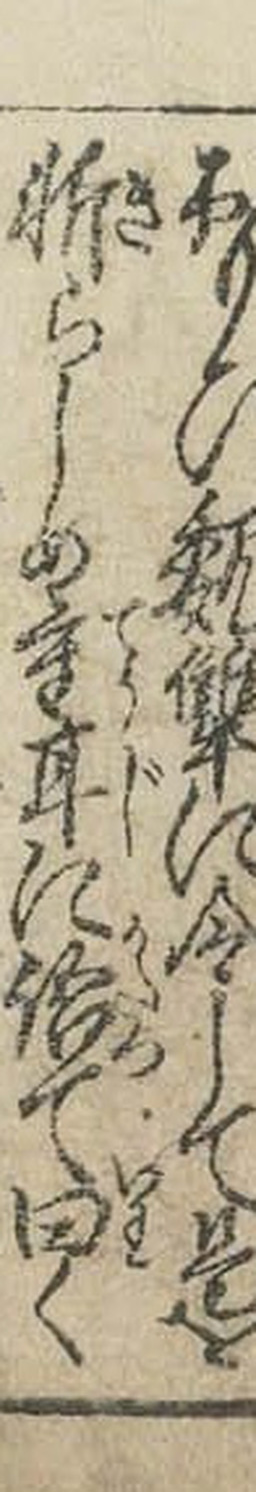斬らしめ重耳に語て曰く
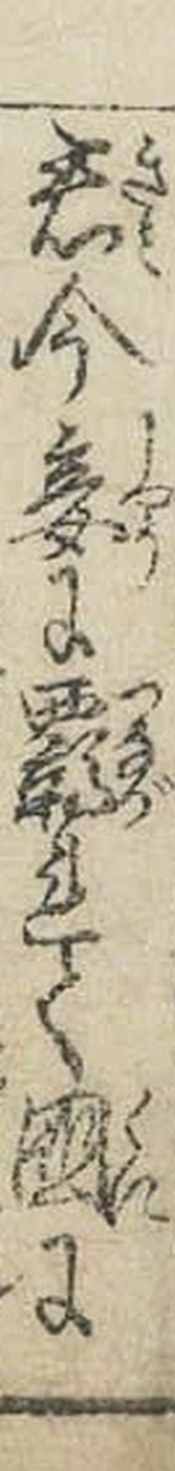君今妾に羈れて国に
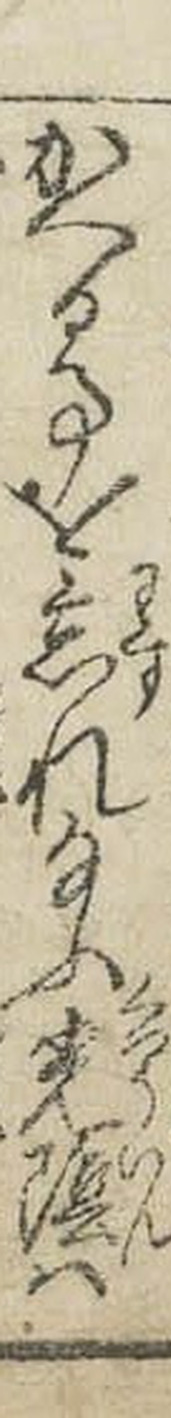かへる事を忘れ給ふ光陰は
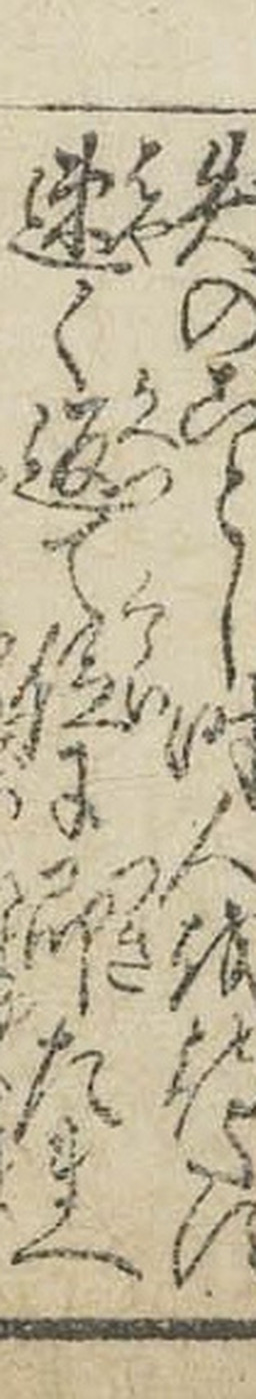速く返て位に即たまへ
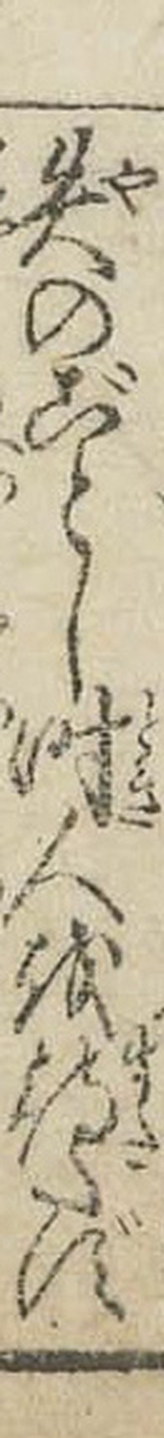矢のごとし時人を待たず
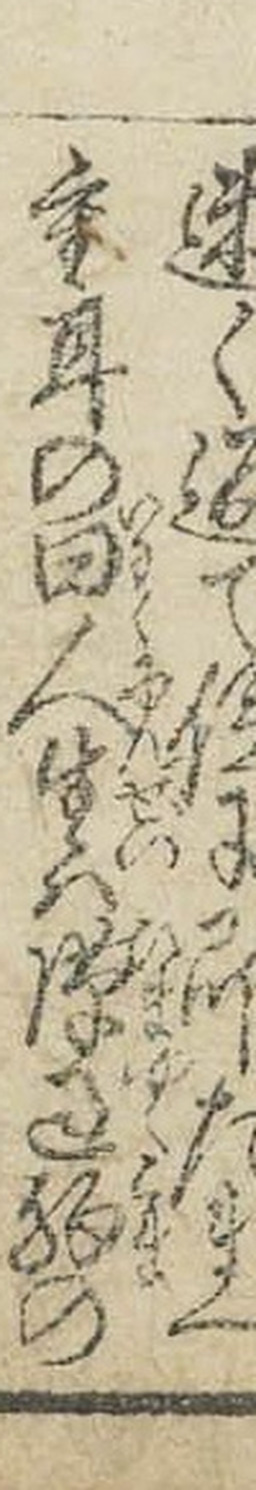重耳の曰人生は隙過駒の
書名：絵本写宝袋 9巻 5之巻
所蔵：東京学芸大学教育コンテンツアーカイブ
